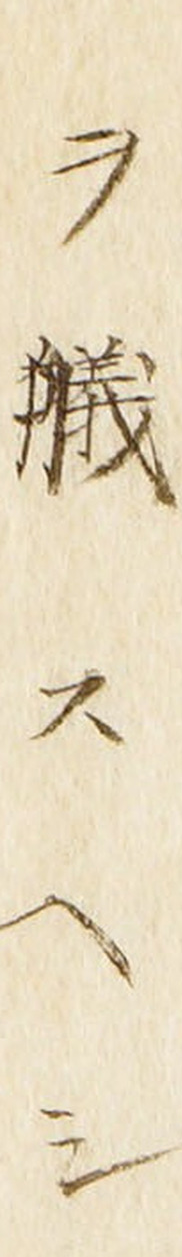ヲ艤スヘシ

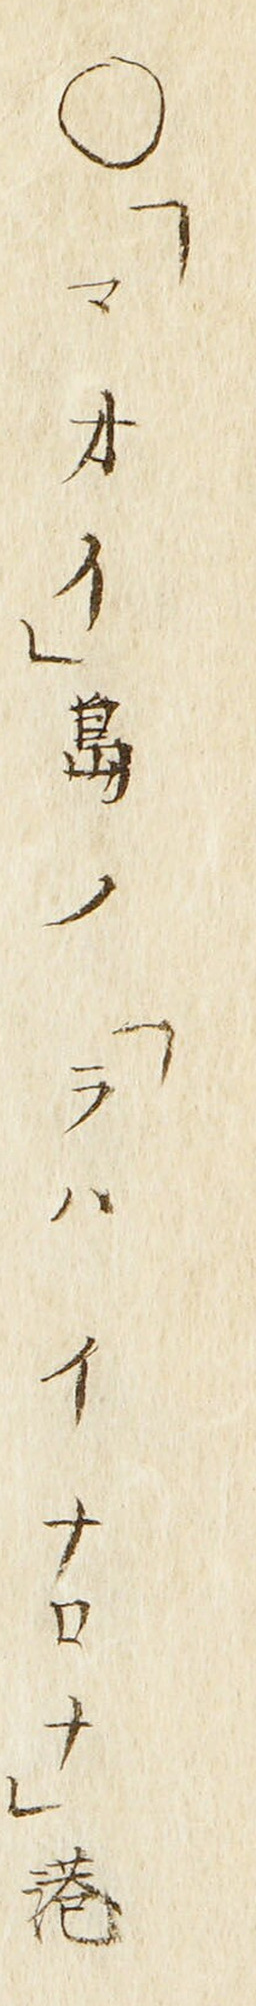〇「マオイ」島ノ「ラハイナロナ」港

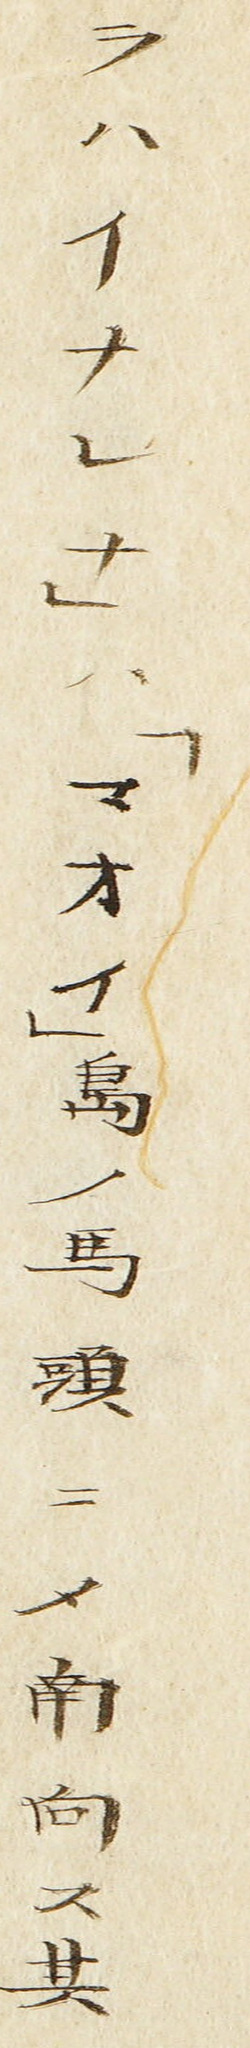ラハイナレナ」、「マオイ」島ノ馬頭ニシテ南向ス其
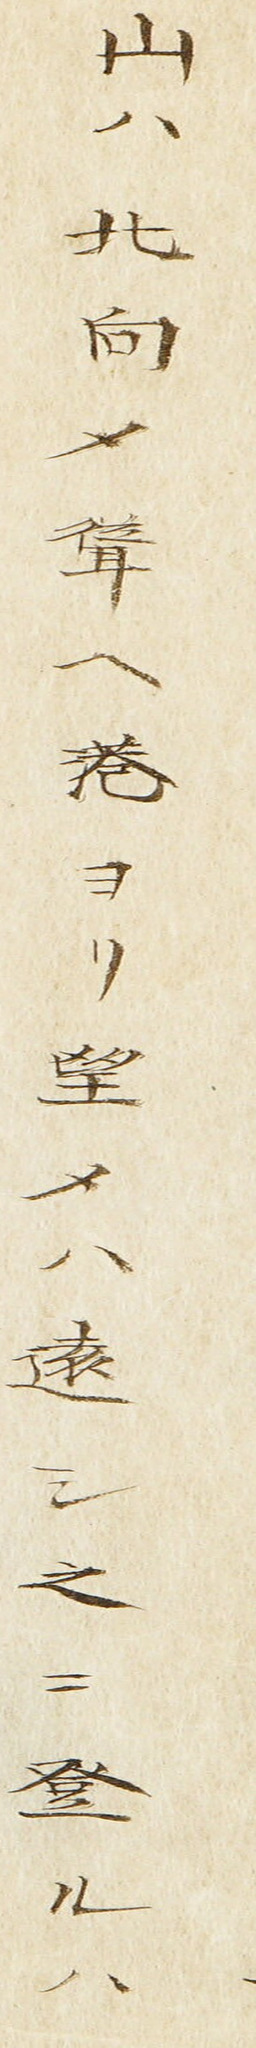山ハ北向シテ聳ヘ港ヨリ望メハ遠シ之ニ登ルハ
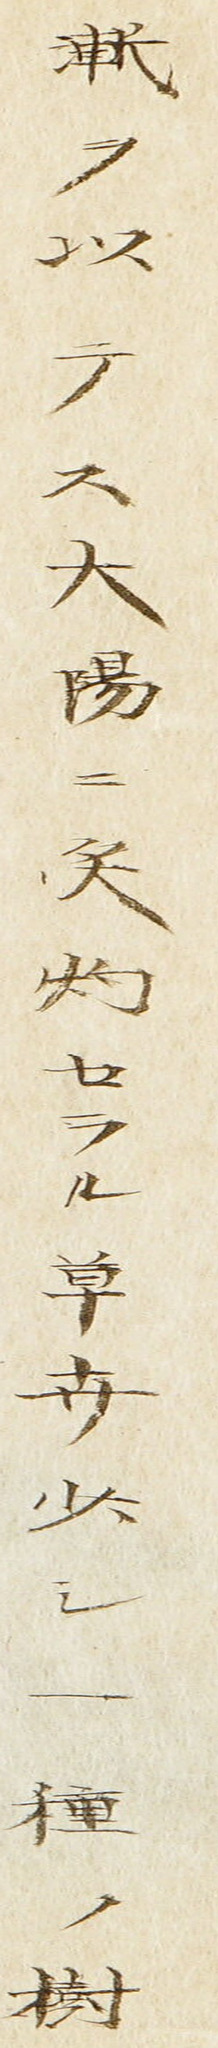漸ヲ以テス大陽ニ炙灼セラル草卉少シ一種ノ樹
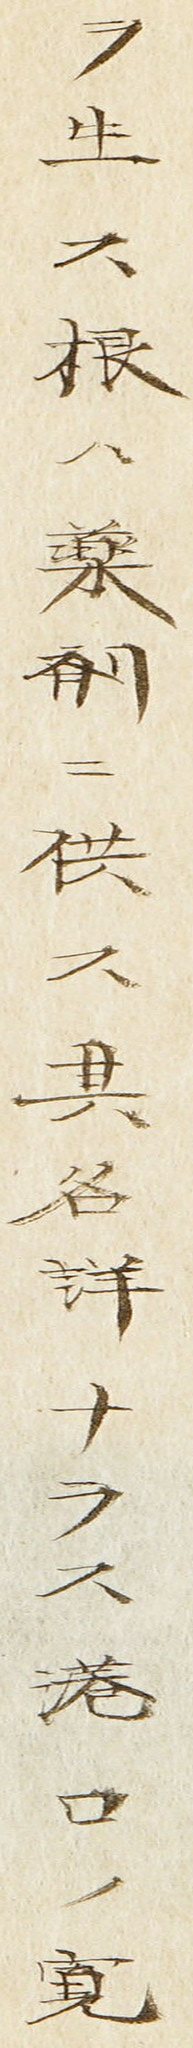ヲ生ス根ハ薬剤ニ供ス其名詳ナラス港口ノ寛
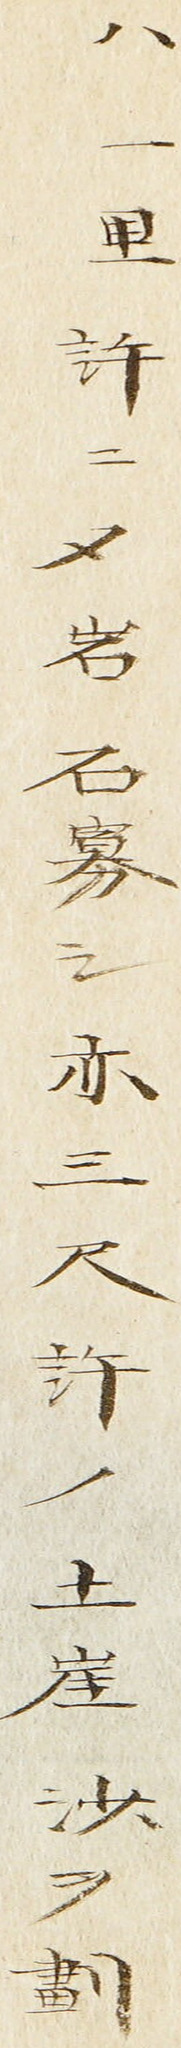ハ一里許ニシテ岩石寡シ亦三尺許ノ土崖沙ヲ劃
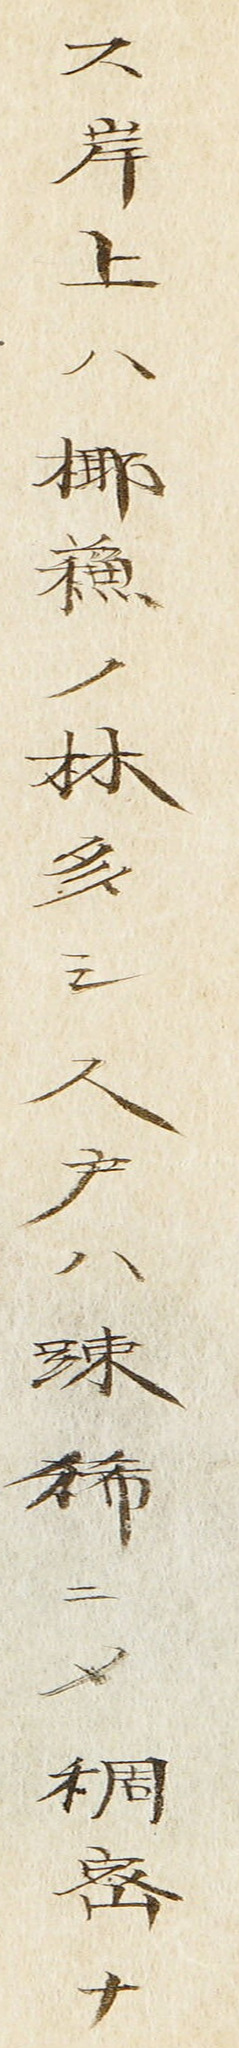ス岸上ハ椰蘓ノ林多シ人戸ハ疎稀ニシテ稠密ナ
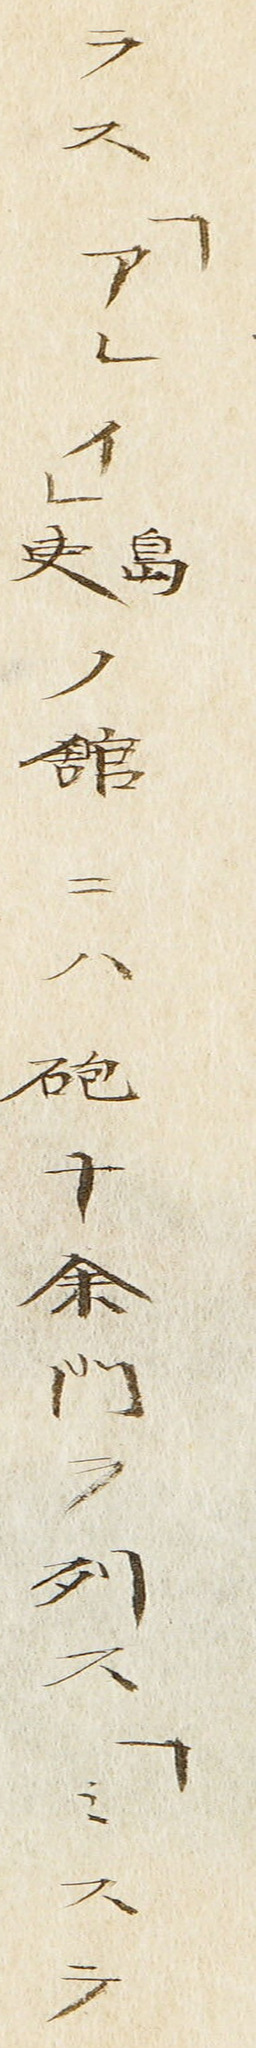ラス「アレイ」島史ノ館ニハ砲十余門ヲ列ス「ミスラ
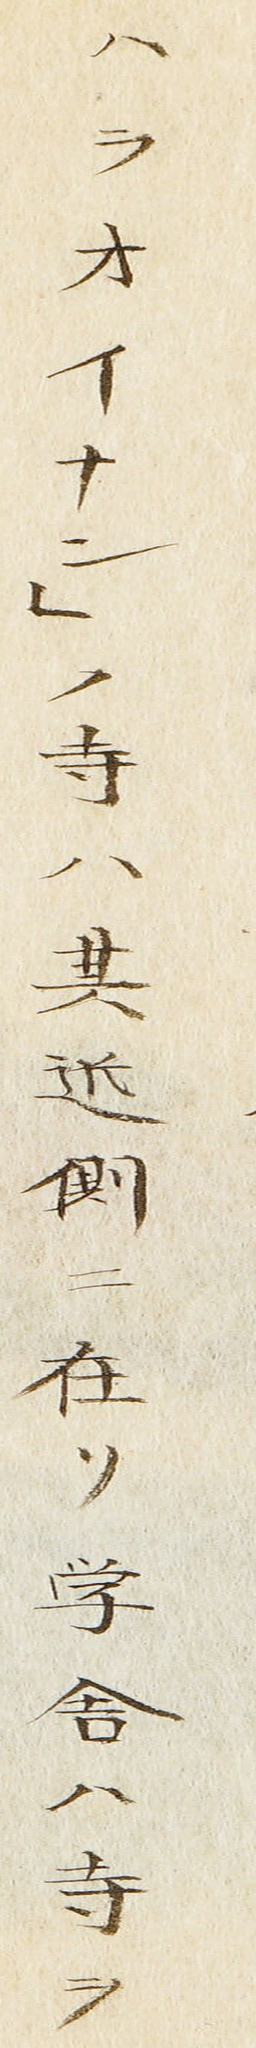ハラオイナン」ノ寺ハ其近側ニ在リ学舎ハ寺ヲ
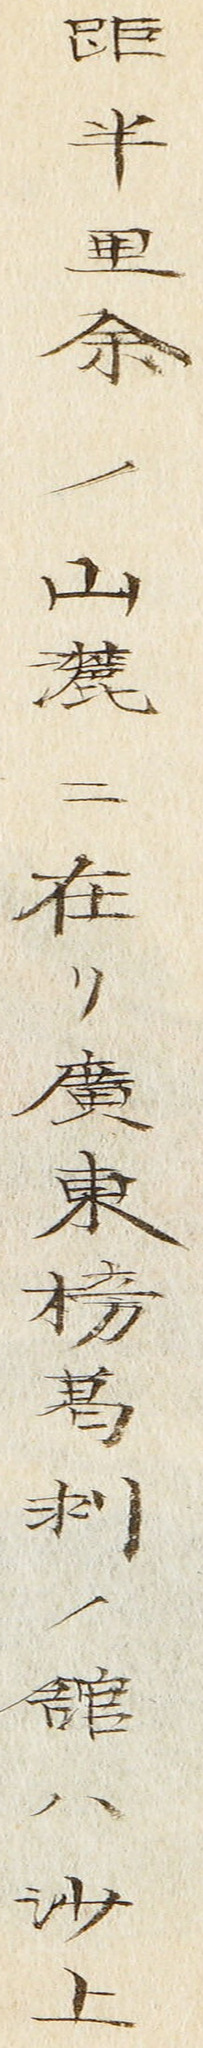距半里余ノ山灑ニ在リ廣東榜葛ノ館ハ沙上
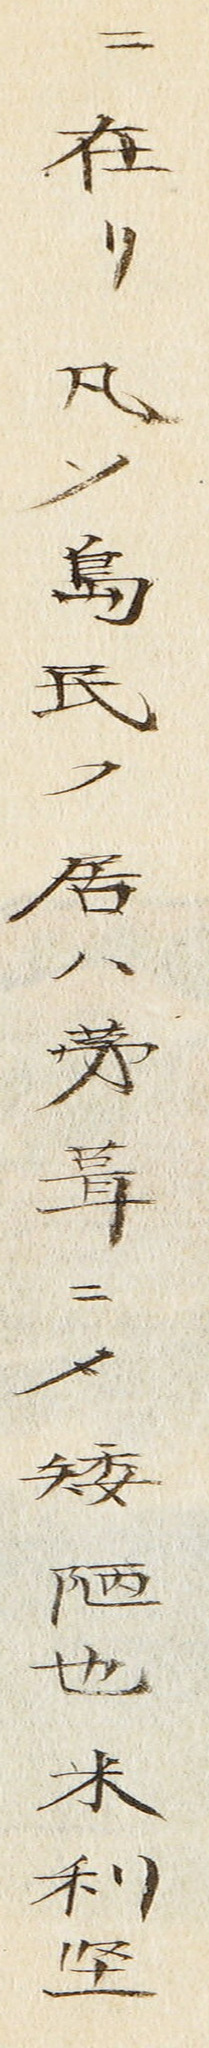ニ在リ凡ソ島民ノ居ハ茅葺ニシテ矮陋也米利堅
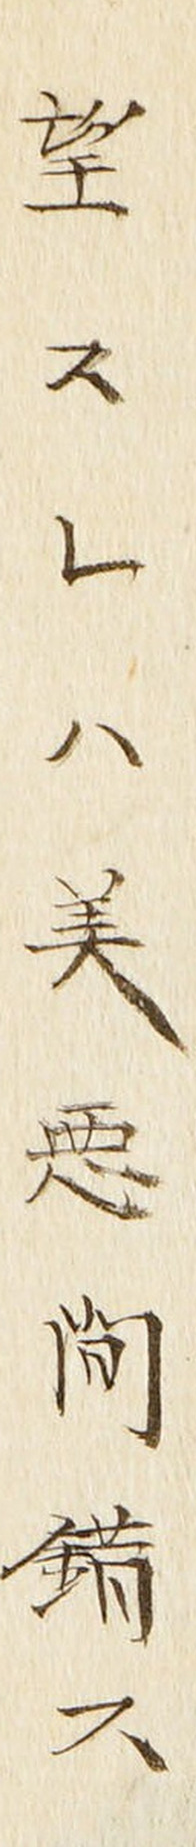望スレハ美悪間錯ス

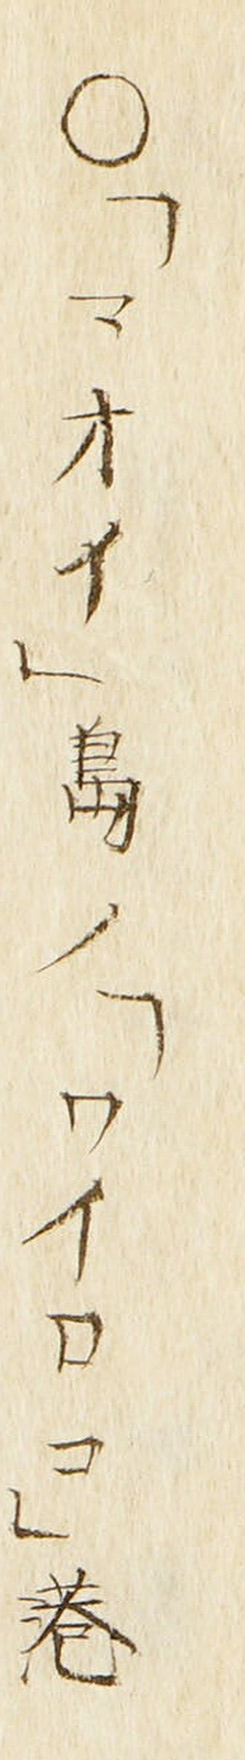〇「マオイ」島ノ「ワイロコ」港

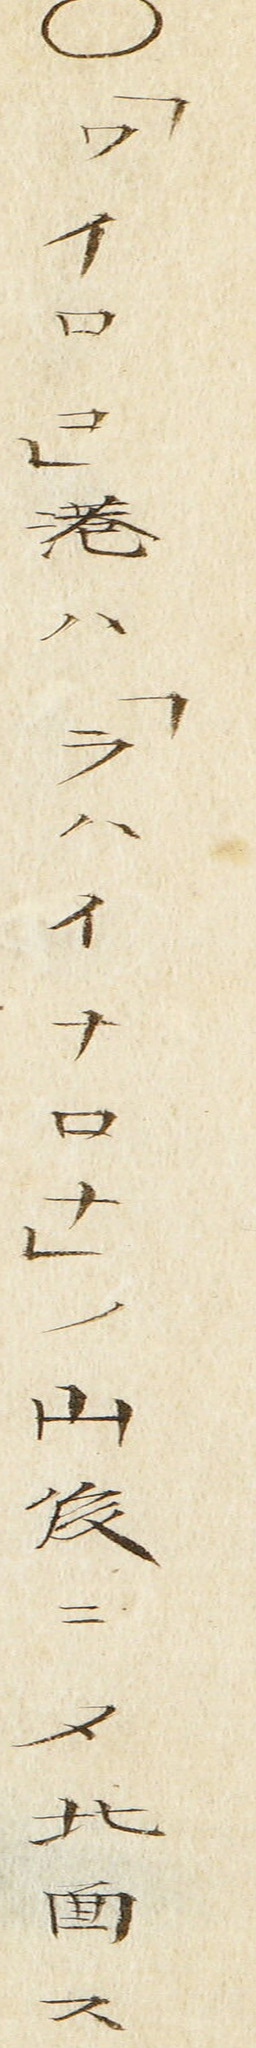〇「ワイロコ」港ハ「ラハイアロナ」ノ山後ニシテ北面ス
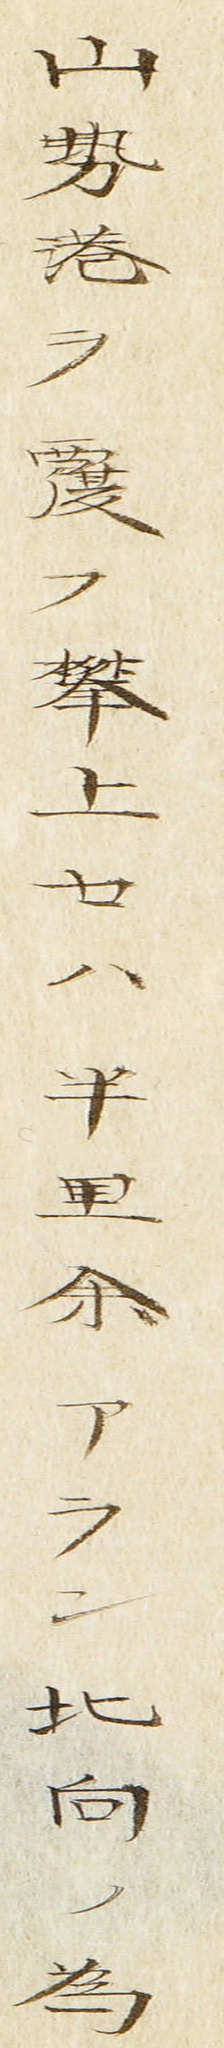山勢港ヲ覆フ攀上セハ半里余アラン北向ノ為
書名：蕃談
